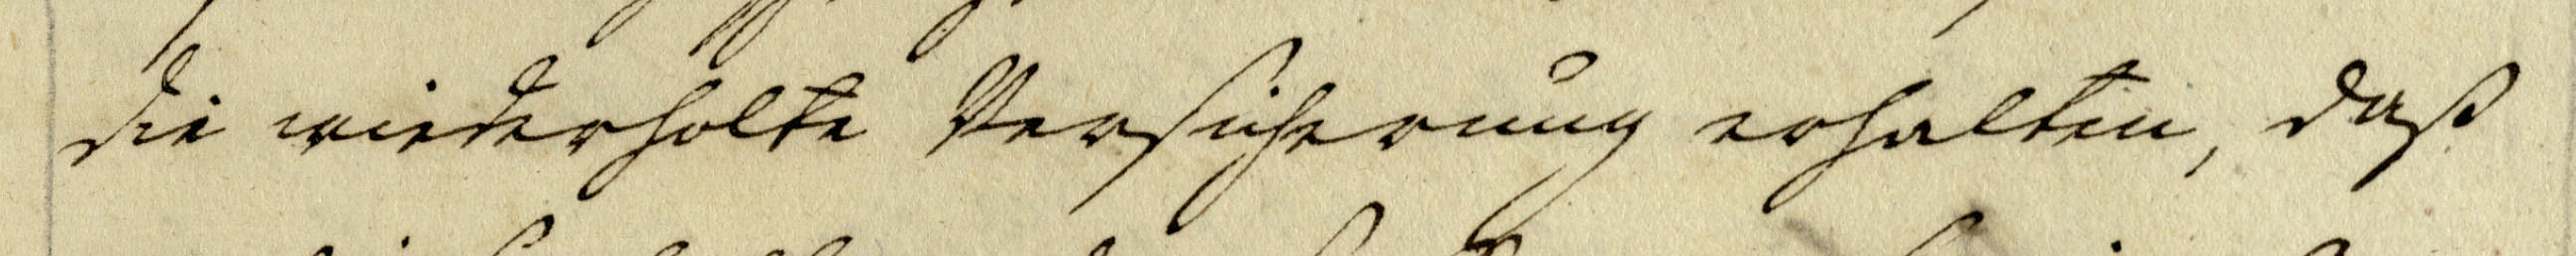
die wiederholte Versicherung erhalten, daß
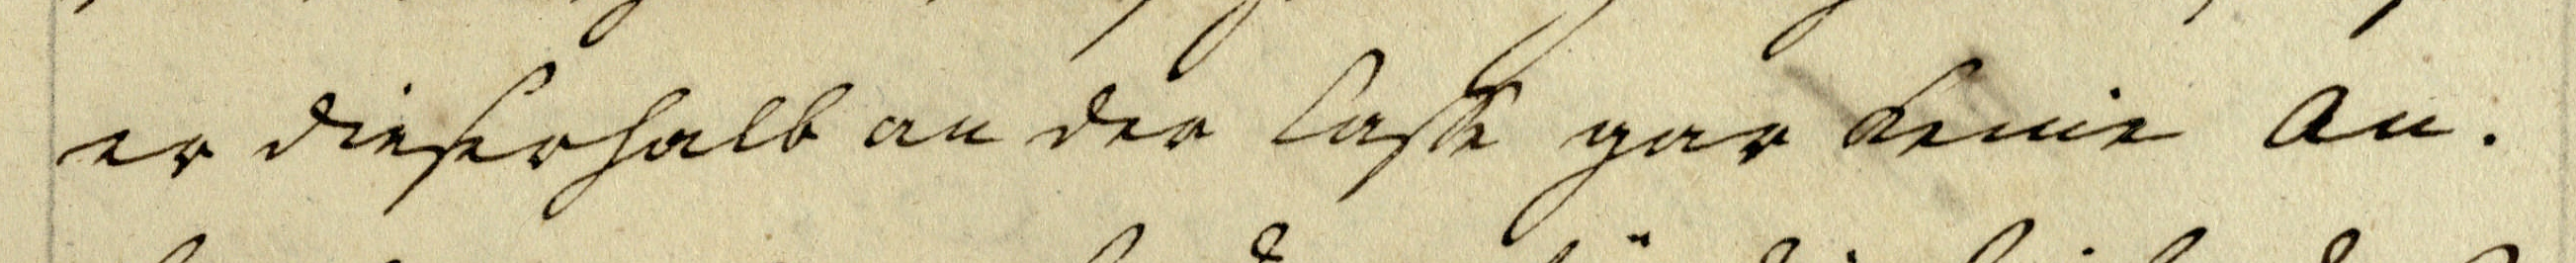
er dieserhalb an der Casse gar keine An¬
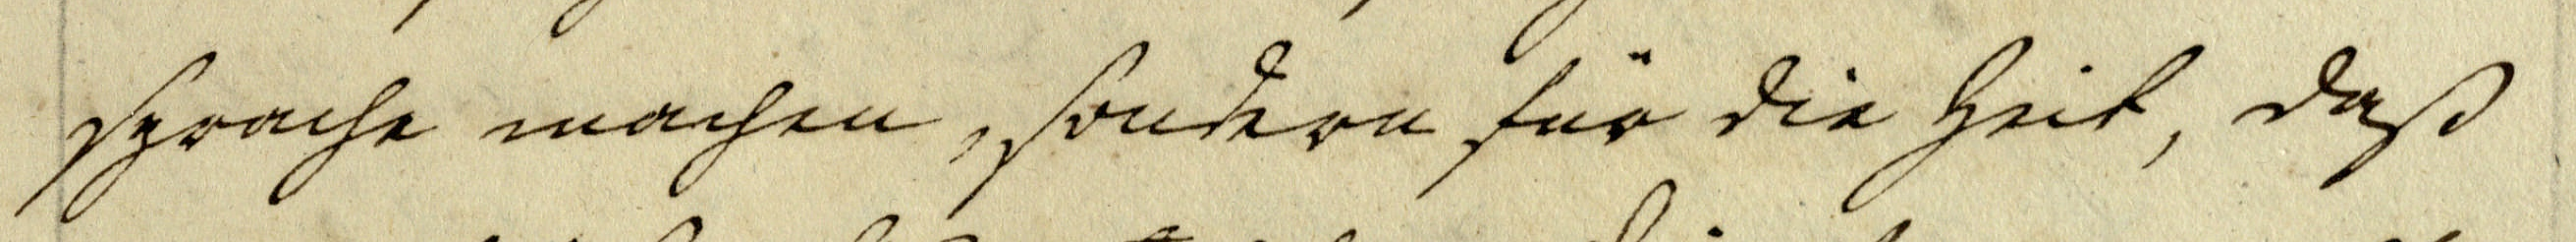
sprache machen, sondern für die Zeit, daß
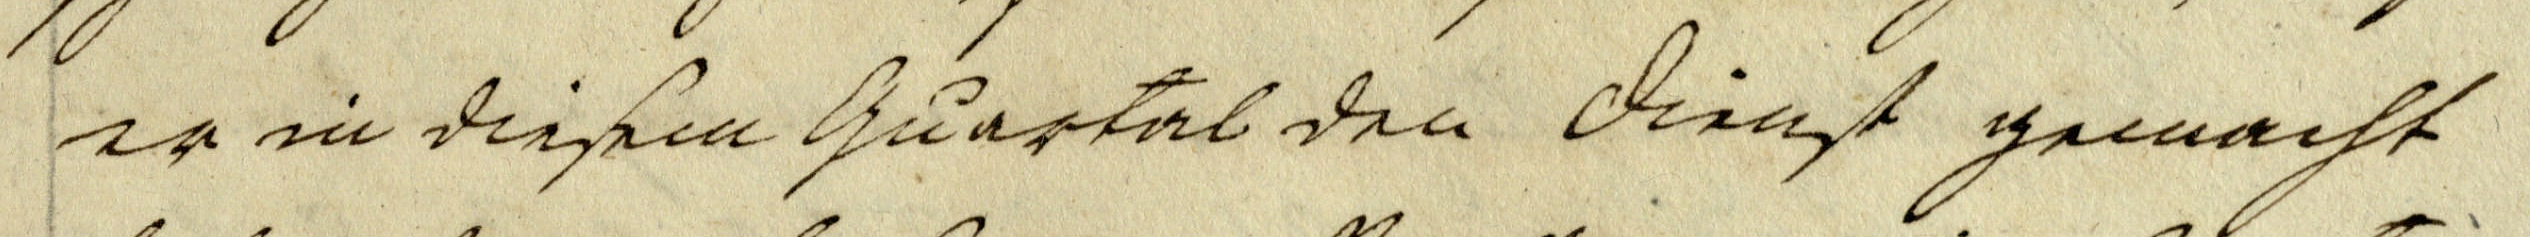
er in diesem Quartal den Dienst gemacht
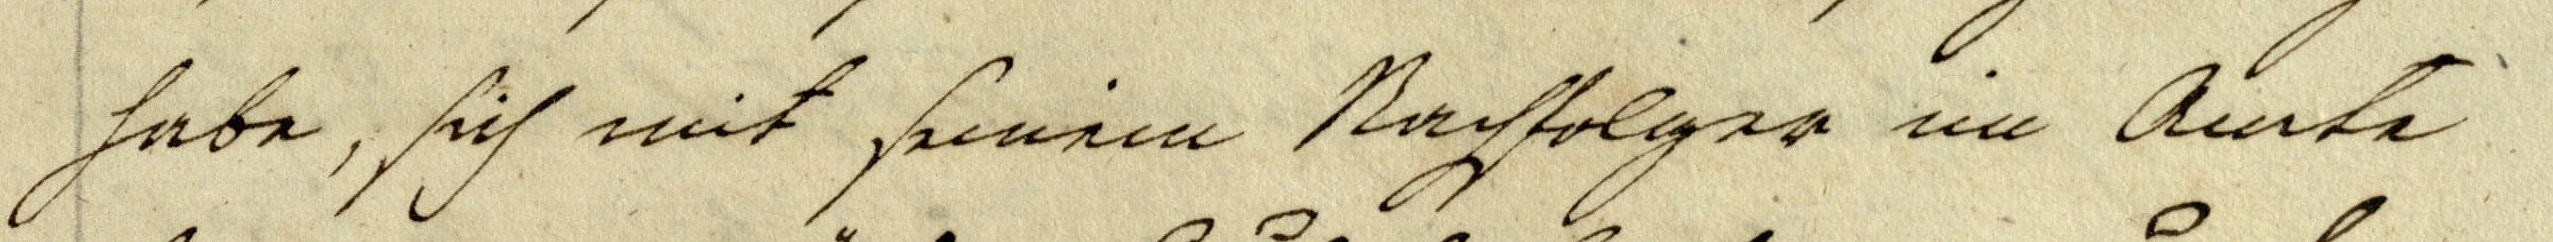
habe, sich mit seinem Nachfolger im Amte
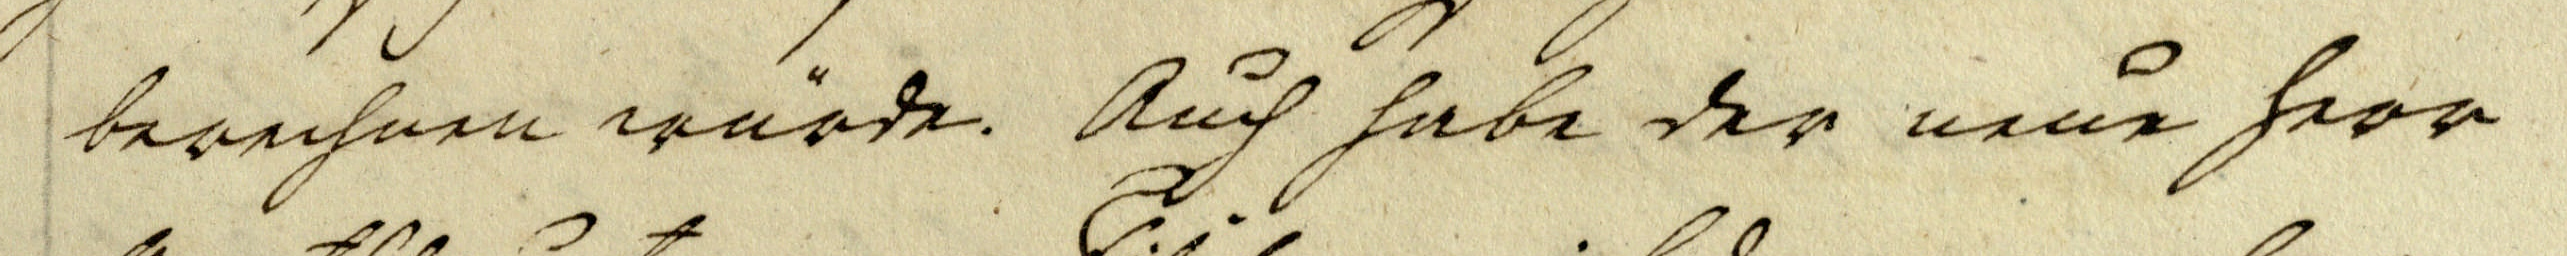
berechnen würde. Auch habe der neue Herr
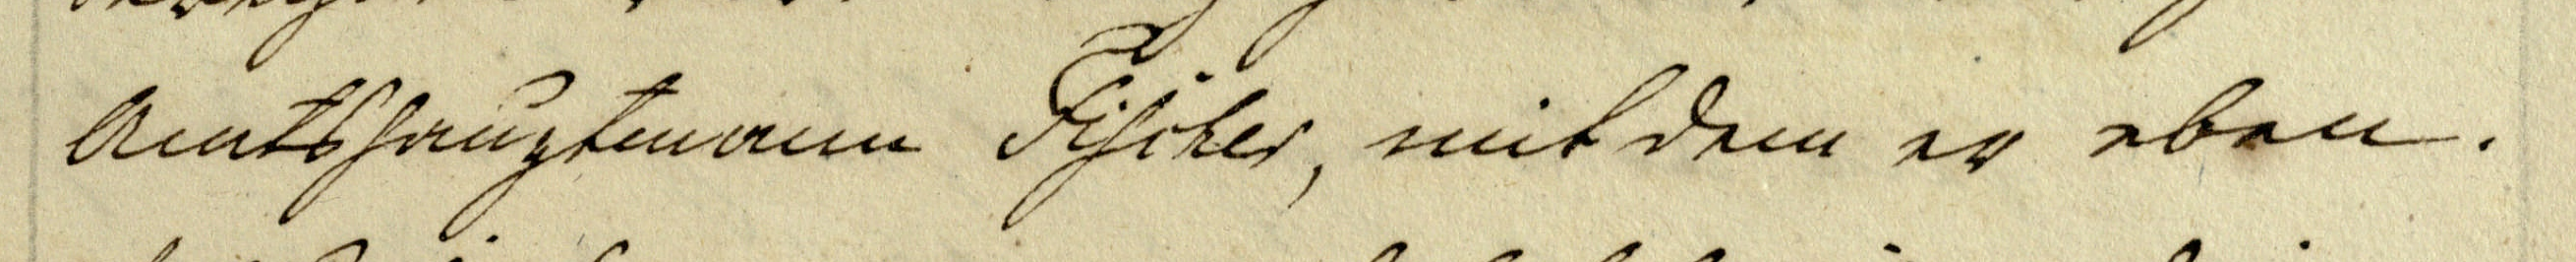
Amtshauptmann Fischer, mit dem er eben¬
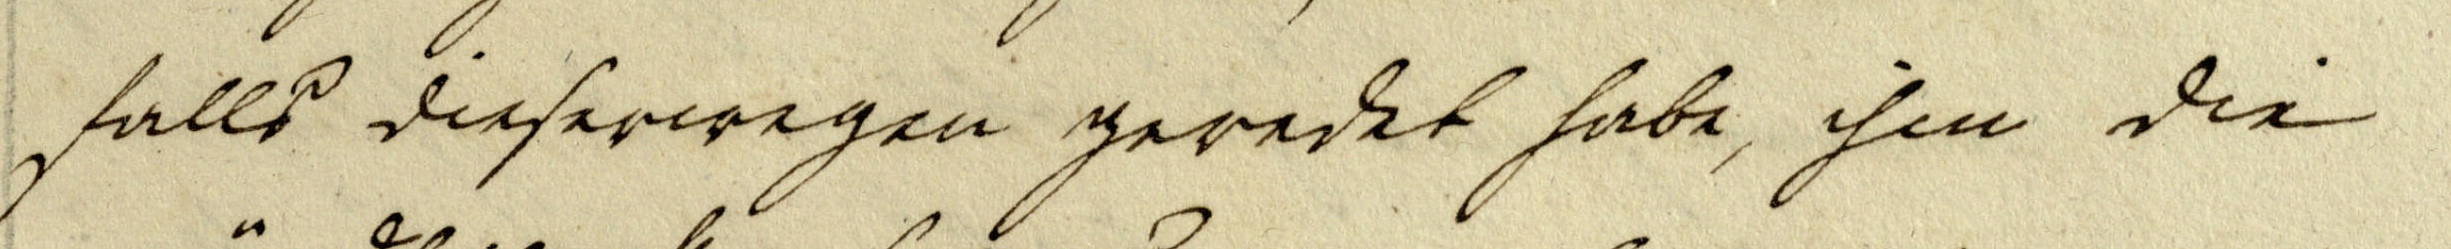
falls dieserwegen geredet habe, ihm die
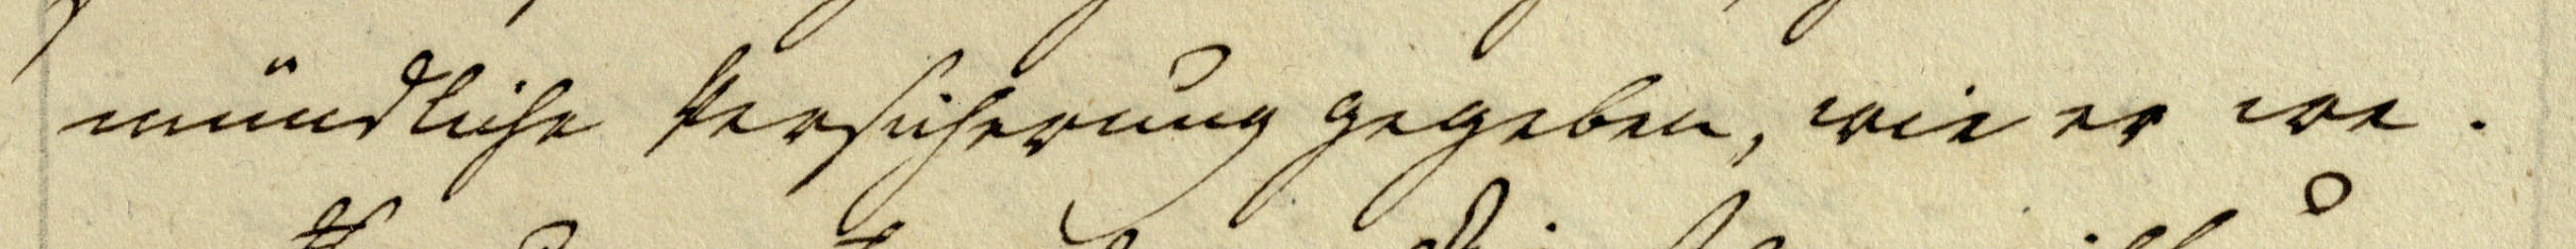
mündliche Versicherung gegeben, wie er we¬
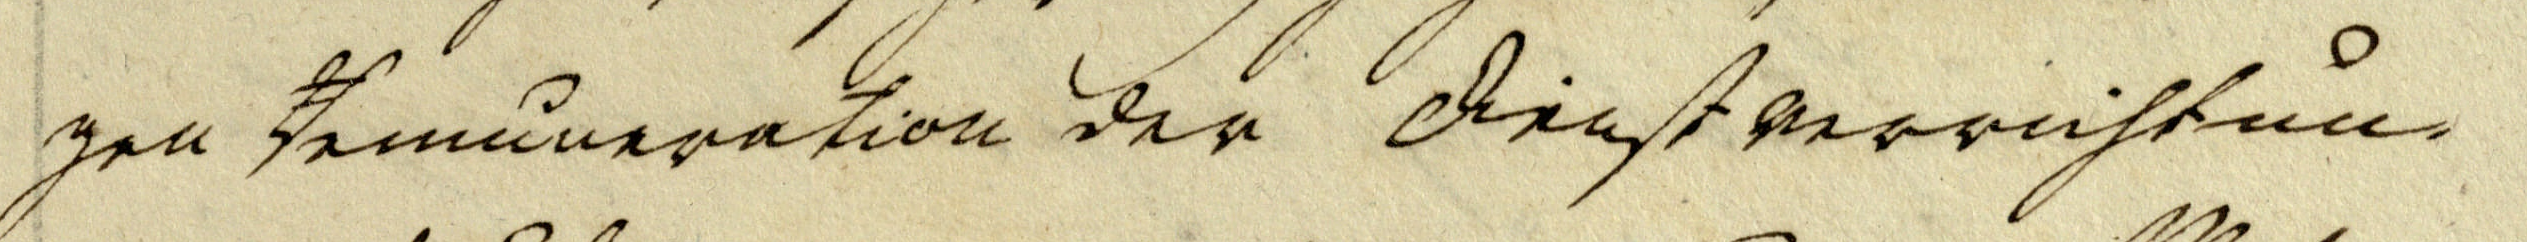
gen Remuneration der Dienstverrichtun¬
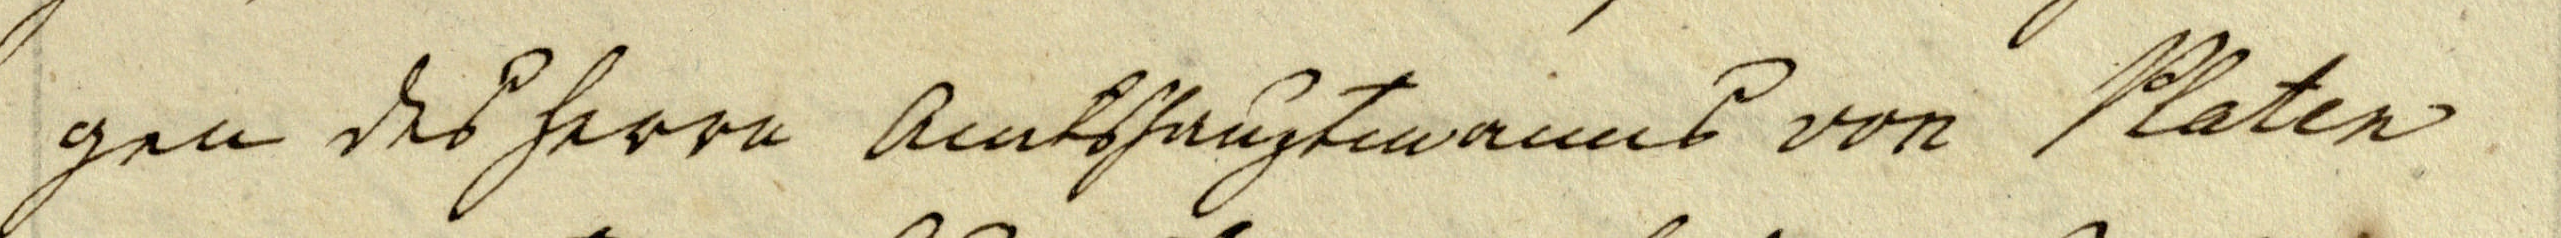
gen des Herrn Amtshauptmanns von Platen
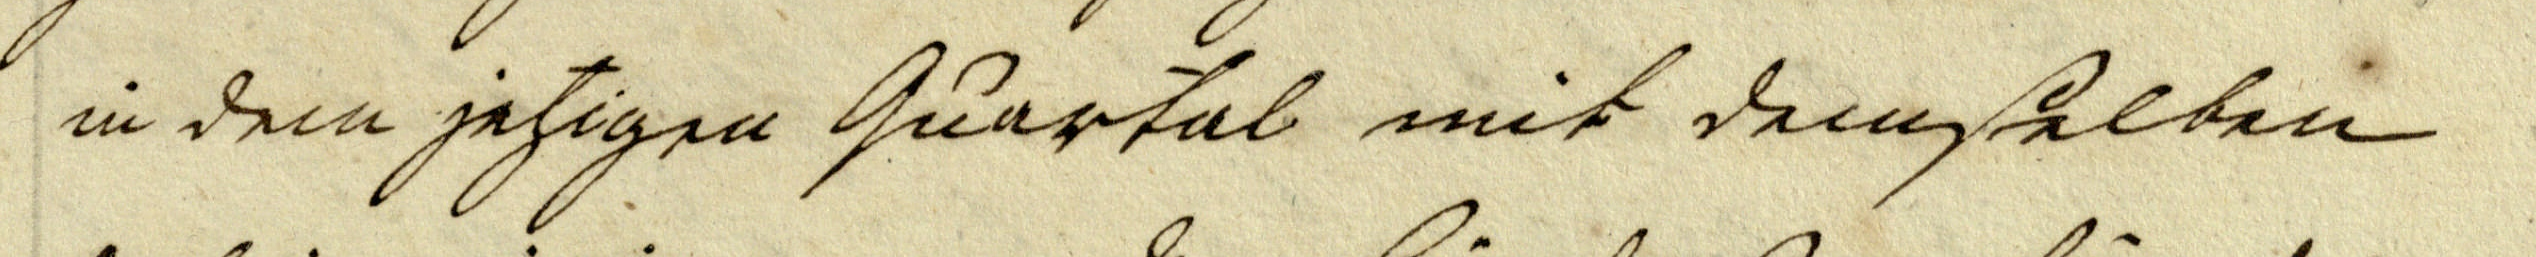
in dem jetzigen Quartal mit demselben
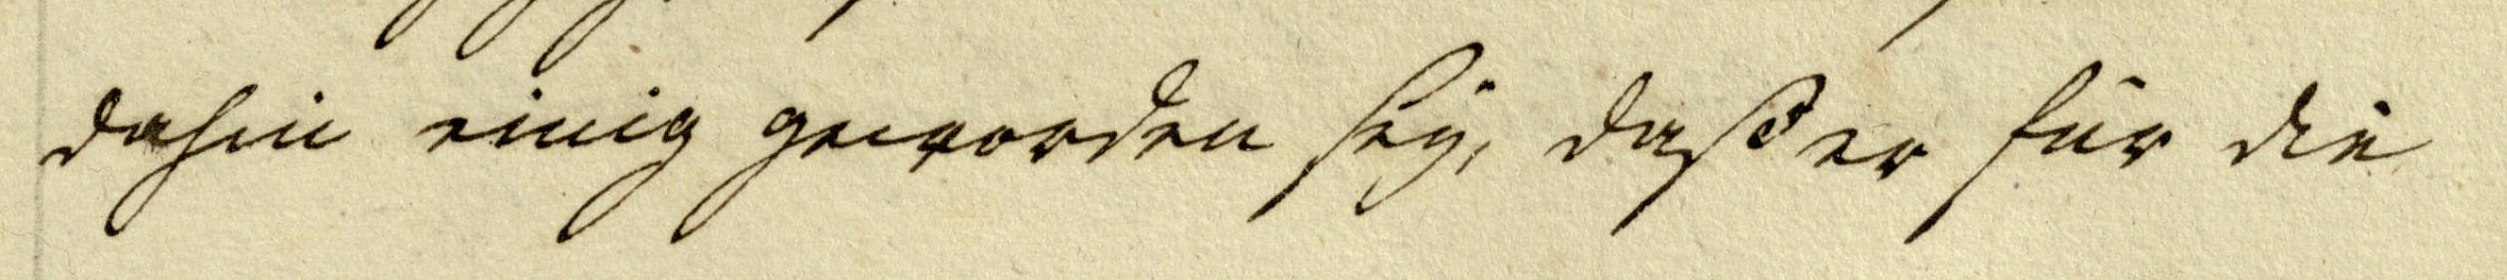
dahin einig geworden seÿ, daß er für die
